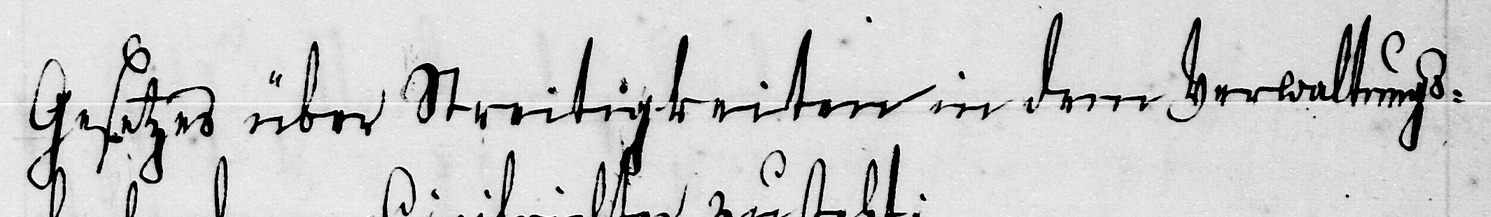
Gesetzes über Streitigkeiten in dem Verwaltungs¬
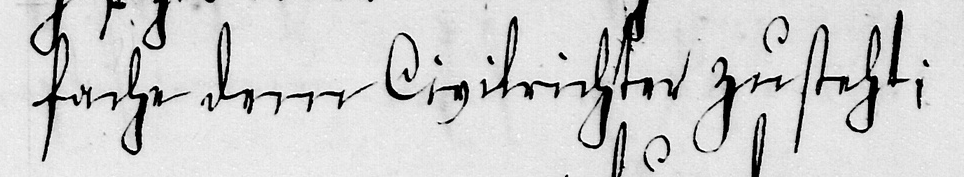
fache dem Civilrichter zusteht;
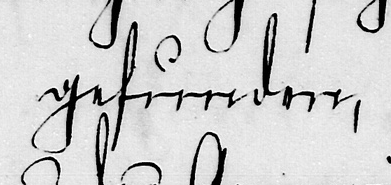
gefunden,
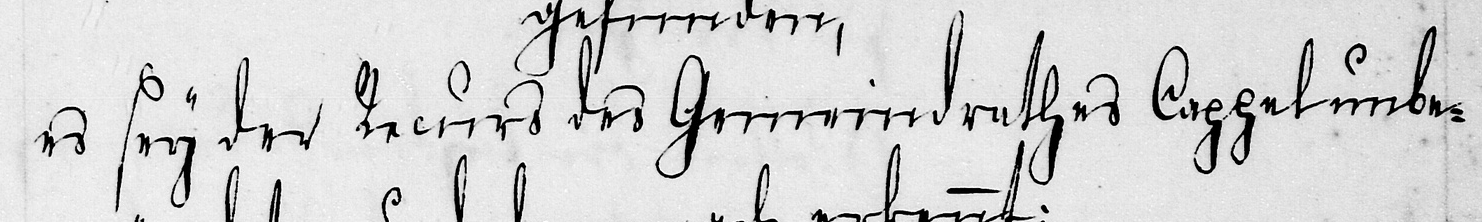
es sey der Recurs des Gemeindrathes Cappel unbe¬
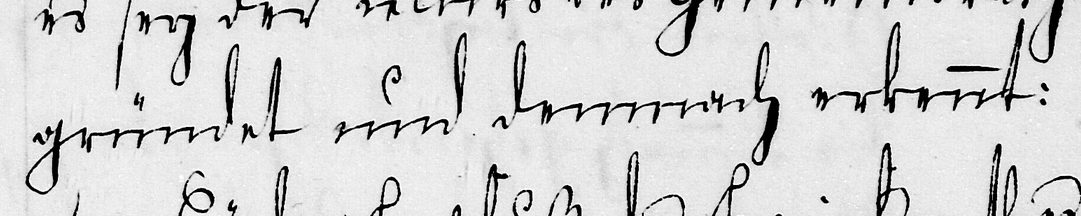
gründet und demnach erkennt:
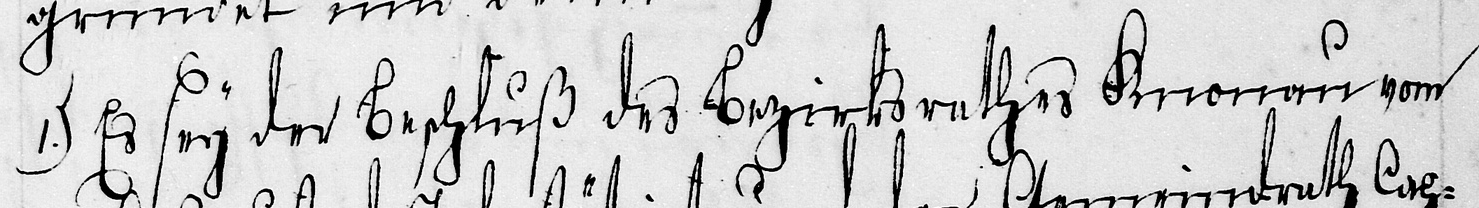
1.) Es sey der Beschluß des Bezirksrathes Knonau vom
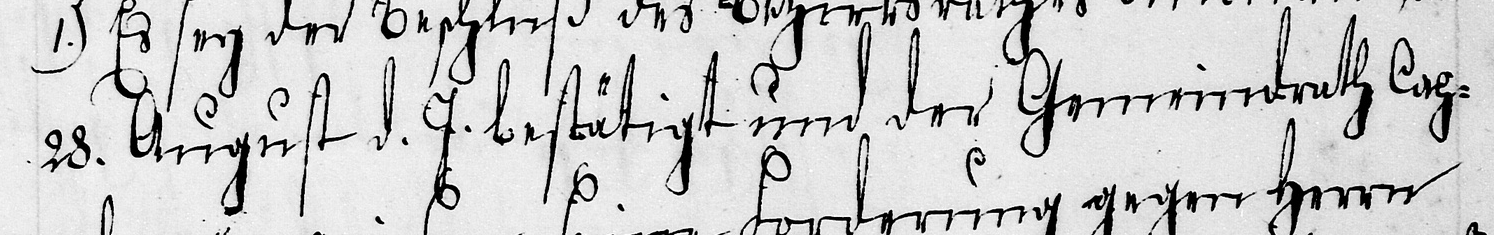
28. August d. J. bestätigt und der Gemeindrath Cap¬
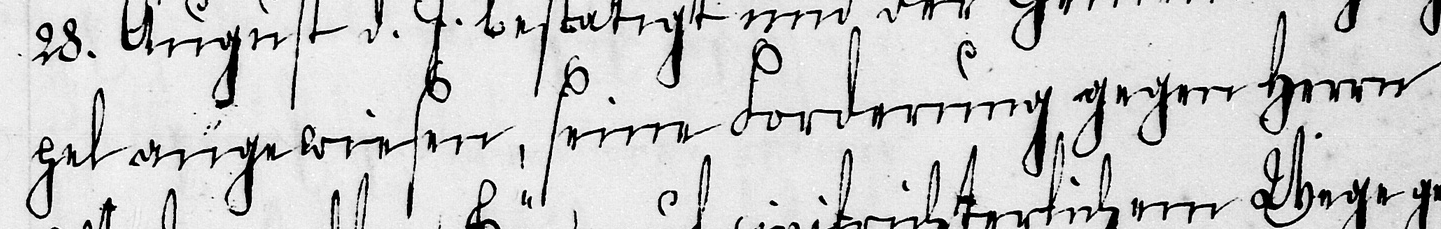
pel angewiesen, seine Forderung gegen Herrn
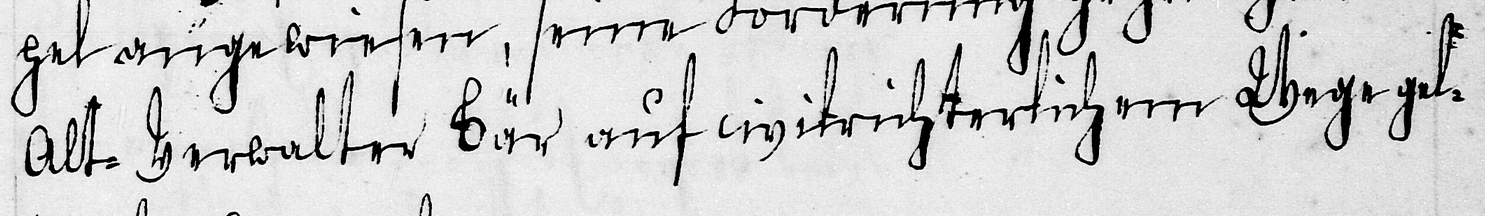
Alt-Verwalter Bär auf civilrichterlichem Wege gel¬
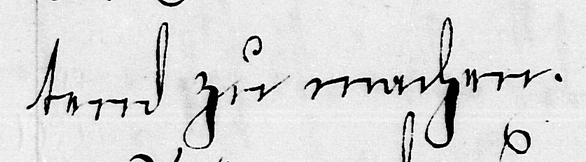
tend zu machen.
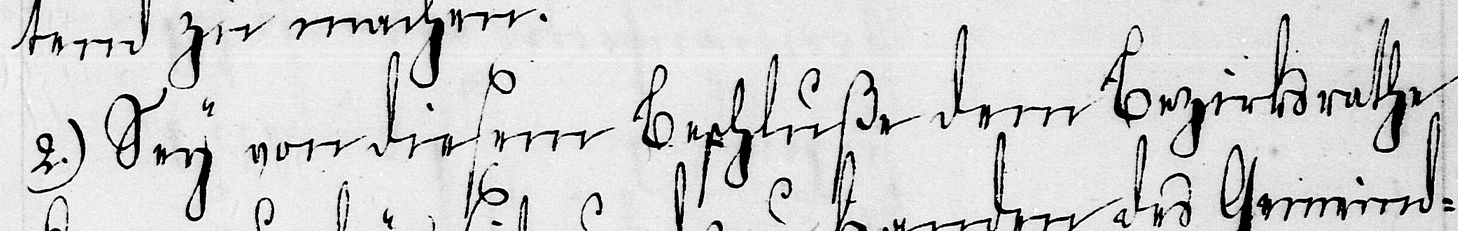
2.) Sey von diesem Beschluße dem Bezirksrathe
